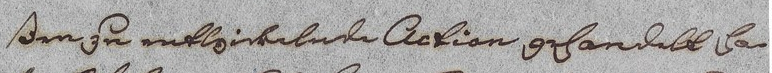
ßen zu entwickelnde Action gehandelt ha-
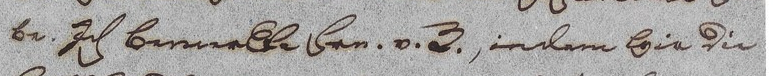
be. Ich bemerkte Hrn. v. R., indem wir die
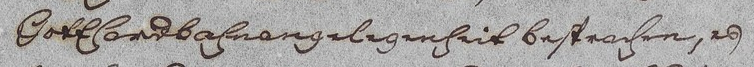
Gotthardbahnangelegenheit besprachen, es
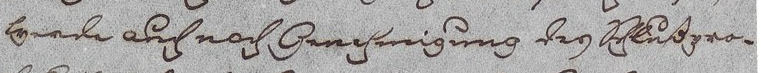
werde auch nach Genehmigung des Schlußpro-
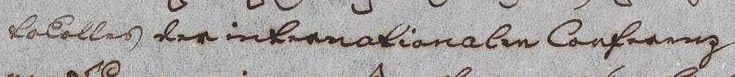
tokolles der internationalen Conferenz
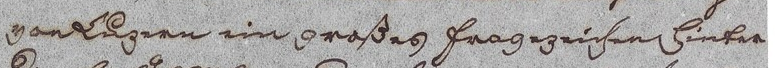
von Luzern ein großes Fragezeichen hinter
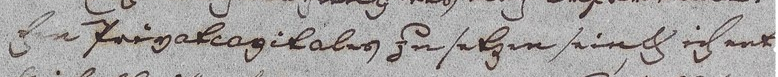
chen Privatcapitales zu setzen sein & ich ent-
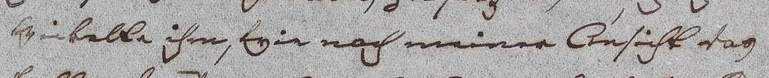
wickelte ihm, wie nach meiner Ansicht das
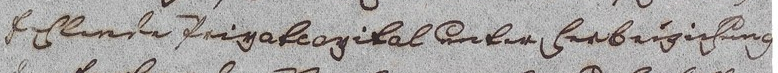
fehlende Privatcapital unter Herbeiziehung
